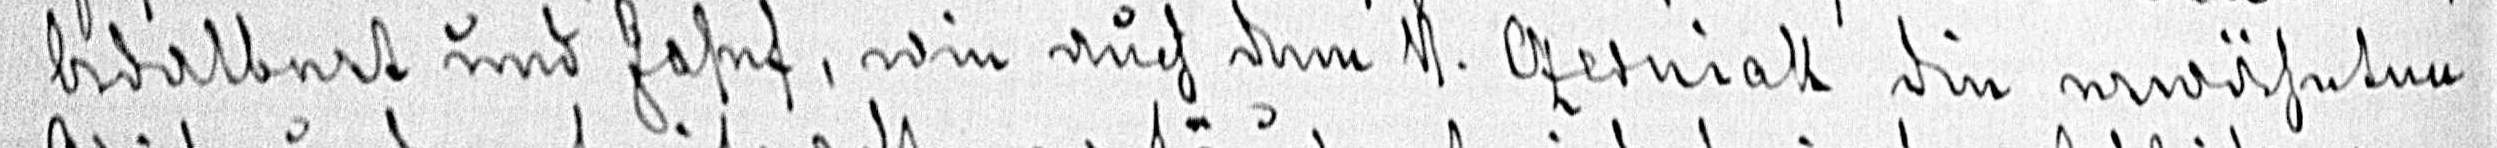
Adalbert und Josef, wie auch dem V. Czedniak die erwähnten
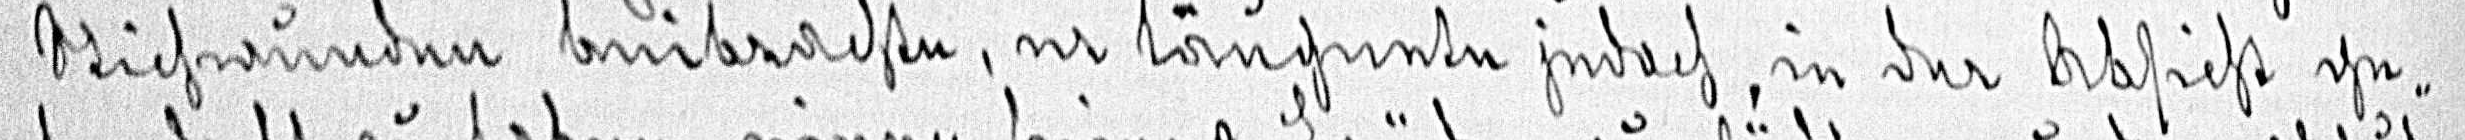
Stichwunden beibrachte, er läugnete jedoch, in der Absicht ge¬
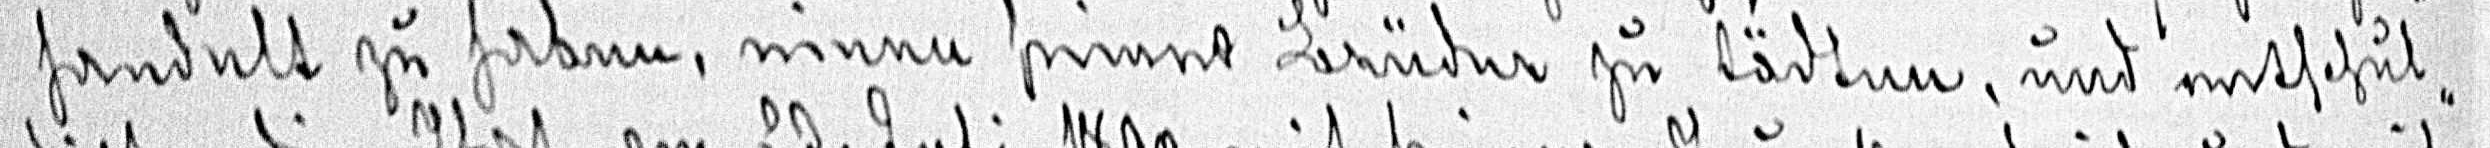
handelt zu haben, einen seiner Brüder zu tödten, und entschul¬
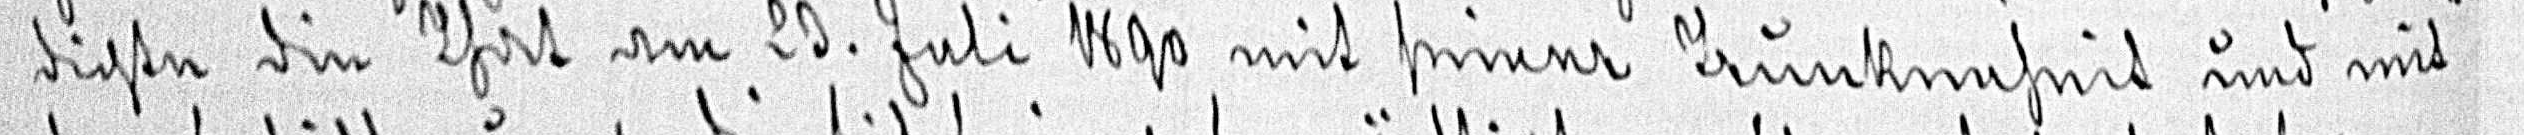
digte die That am 23. Juli 1890 mit seiner Trunkenheit und mit
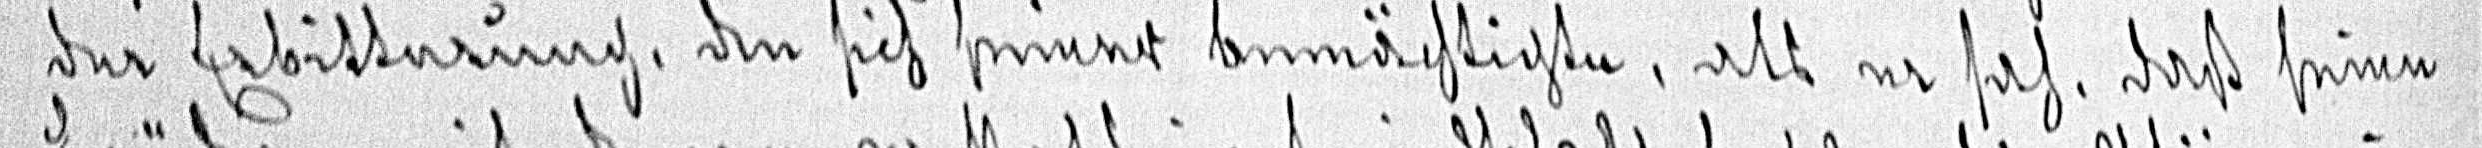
der Erbitterung, die sich seiner bemächtigte, als er sah, daß seine
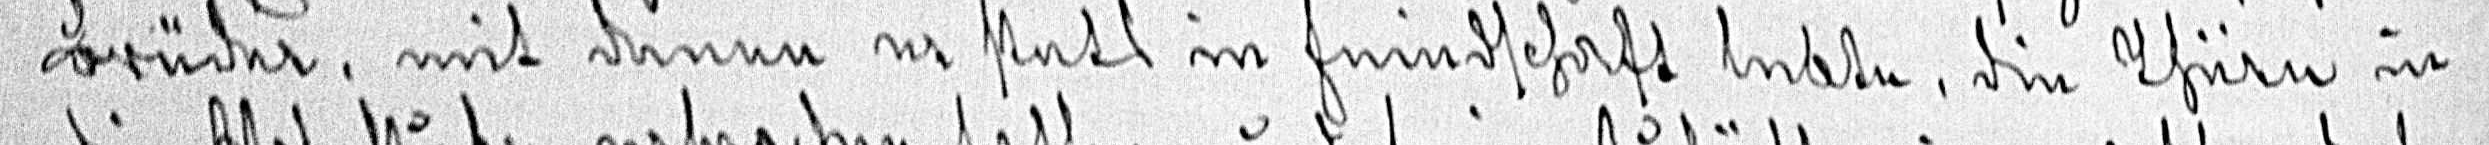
Brüder, mit denen er stets in Feindschaft lebte, die Thüre in
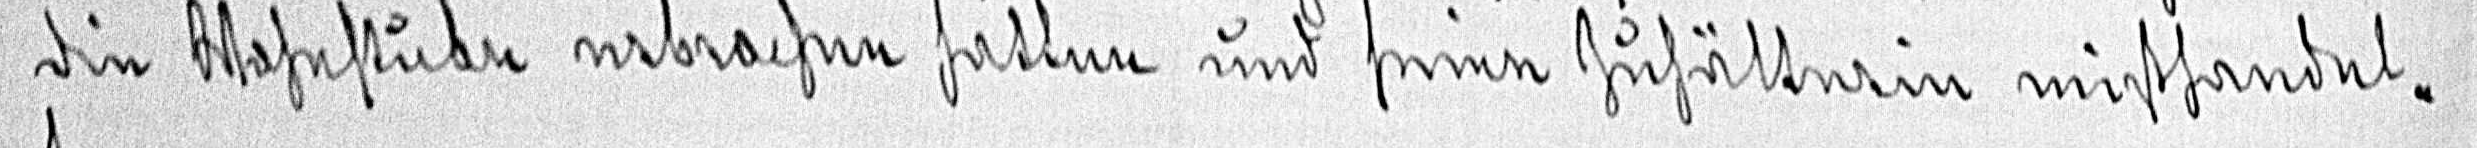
die Wohnstube erbrachen hatten und seine Zuhälterin mißhandel¬
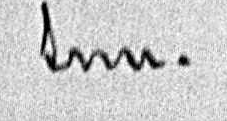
ten.
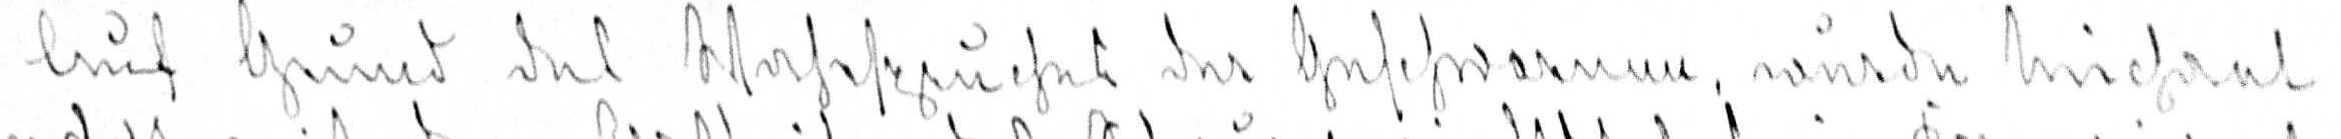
Auf Grund des Wahrspruches der Geschworene, wurde Michael
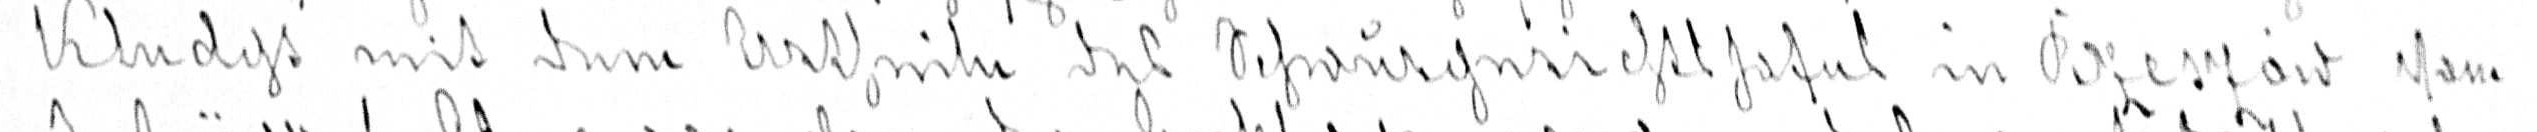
Kludys mit dem Urtheile des Schwurgerichtshofes in Rzeszów vom
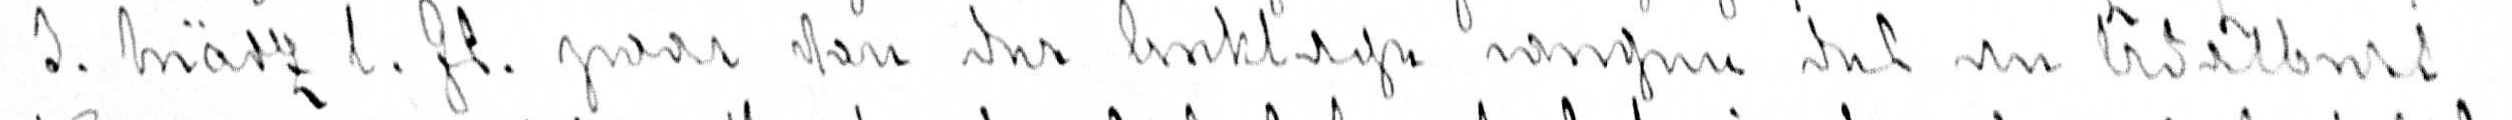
3 März l. Js. zwar von der Anklage wegen des an Adalbert
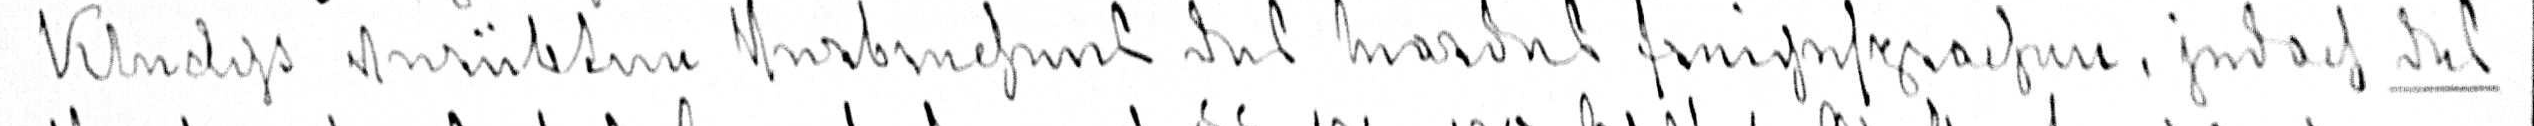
Kludys verübten Verbrechens des Mordes freigesprochen, jedoch des
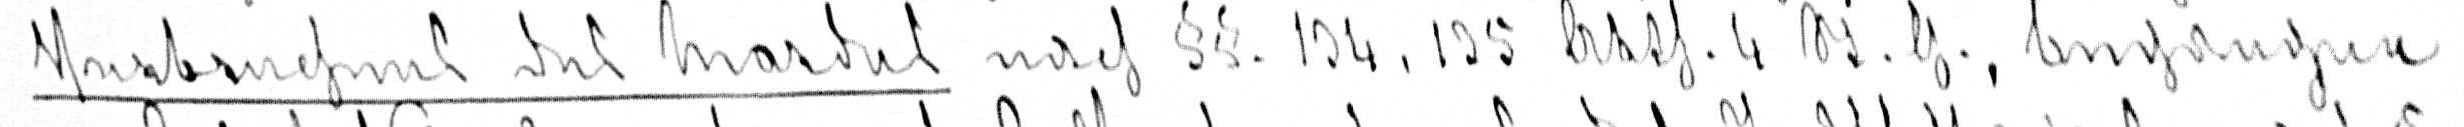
Verbrechens des Mordes nach §§ 134, 135 Akth. 4 St. G., begangen
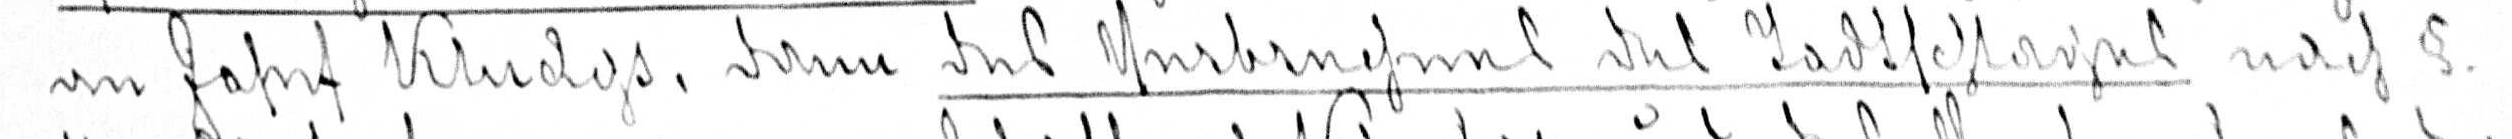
an Josef Kludys, dann des Verbrechens des Todtschlages nach §
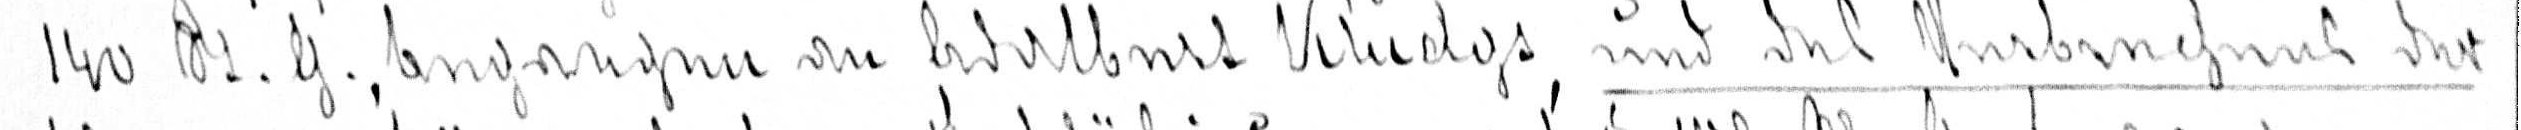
140 St. G. begangen an Adalbert Kludys, und des Verbrechens der
